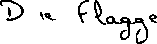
Die Flagge
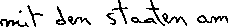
mit dem staaten am
